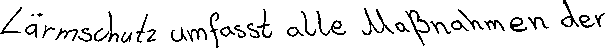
Lärmschutz umfasst alle Maßnahmen der
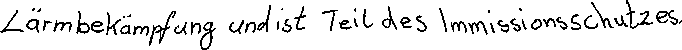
Lärmbekämpfung und ist Teil des Immissionsschutzes.
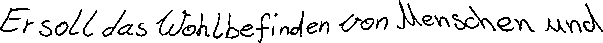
Er soll das Wohlbefinden von Menschen und
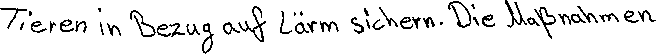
Tieren in Bezug auf Lärm sichern. Die Maßnahmen
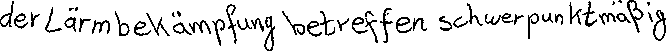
der Lärmbekämpfung betreffen schwerpunktmäßig
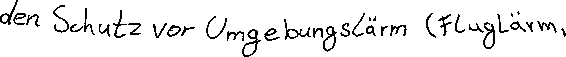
den Schutz vor Umgebungslärm (Fluglärm,
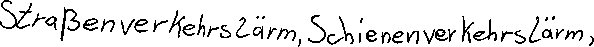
Straßenverkehrslärm, Schienenverkehrslärm,
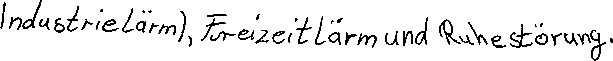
Industrielärm), Freizeitlärm und Ruhestörung.
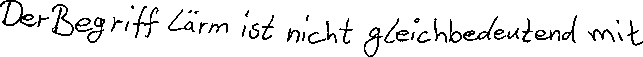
Der Begriff Lärm ist nicht gleichbedeutend mit
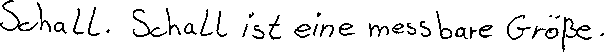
Schall. Schall ist eine messbare Größe.
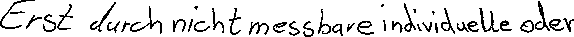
Erst durch nicht messbare individuelle oder
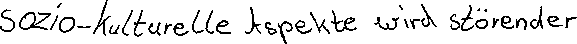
sozio-kulturelle Aspekte wird störender
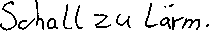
Schall zu Lärm.
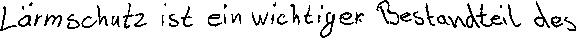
Lärmschutz ist ein wichtiger Bestandteil des
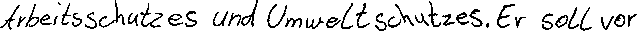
Arbeitsschutzes und Umweltschutzes. Er soll vor
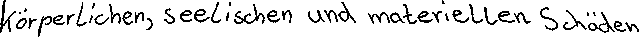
körperlichen, seelischen und materiellen Schäden
